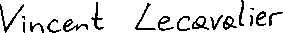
Vincent Lecavalier
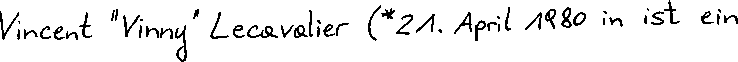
Vincent "Vinny" Lecavalier (* 21. April 1980 in ist ein
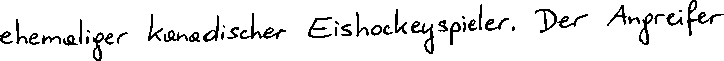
ehemaliger kanadischer Eishockeyspieler. Der Angreifer
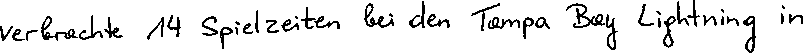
verbrachte 14 Spielzeiten bei den Tampa Bay Lightning in
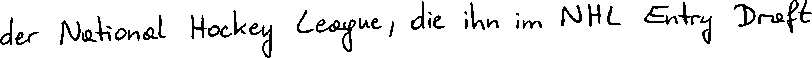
der National Hockey League, die ihn im NHL Entry Draft
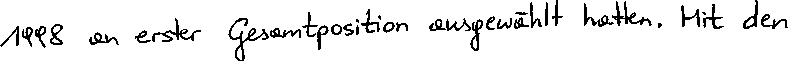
1998 an erster Gesamtposition ausgewählt hatten. Mit den
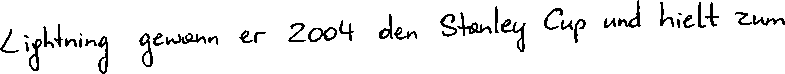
Lightning gewann er 2004 den Stanley Cup und hielt zum
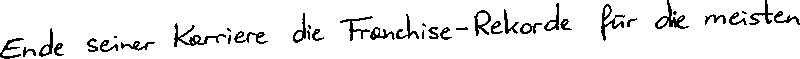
Ende seiner Karriere die Franchise-Rekorde für die meisten
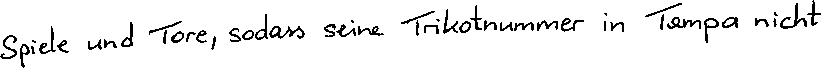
Spiele und Tore, sodass seine Trikotnummer in Tampa nicht
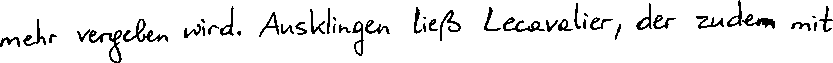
mehr vergeben wird. Ausklingen ließ Lecavalier, der zudem mit
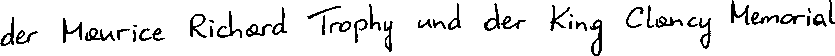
der Maurice Richard Trophy und der King Clancy Memorial
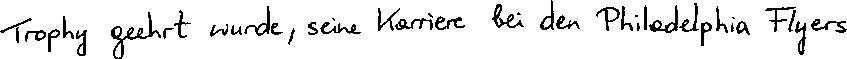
Trophy geehrt wurde, seine Karriere bei den Philadelphia Flyers
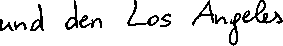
und den Los Angeles
